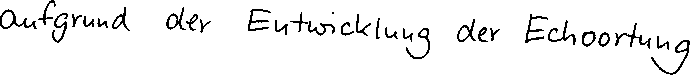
aufgrund der Entwicklung der Echoortung
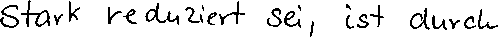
stark reduziert sei, ist durch
